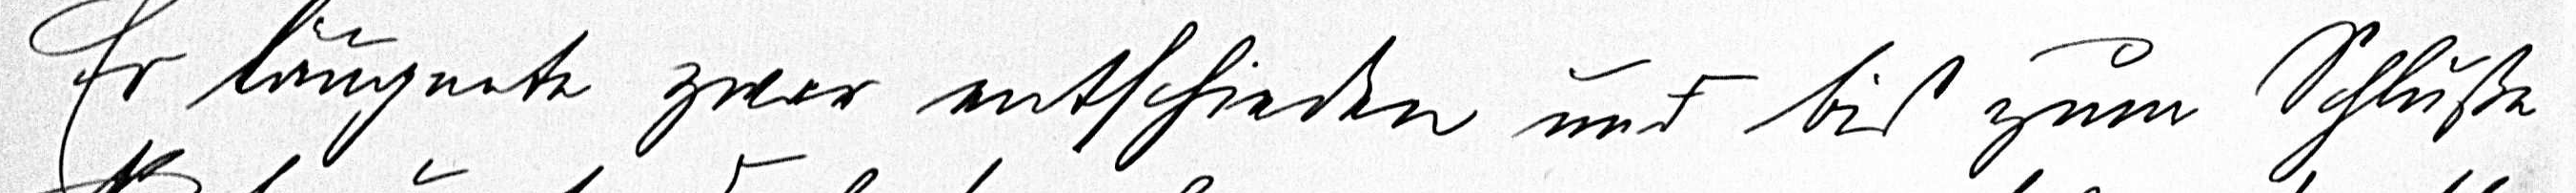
Er läugnete zwar entschieden und bis zum Schluße
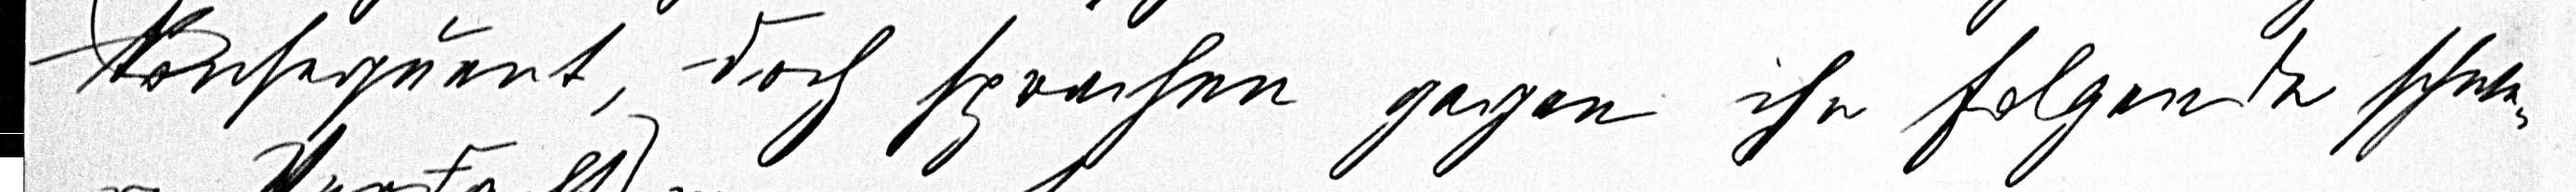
konsequent, doch sprachen gegen ihn folgende schwe¬
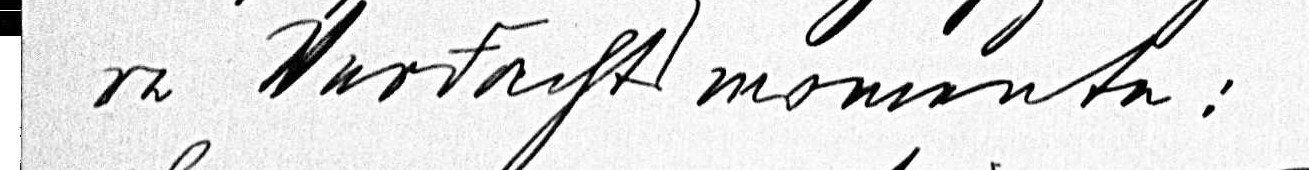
re Verdachtsmomente:
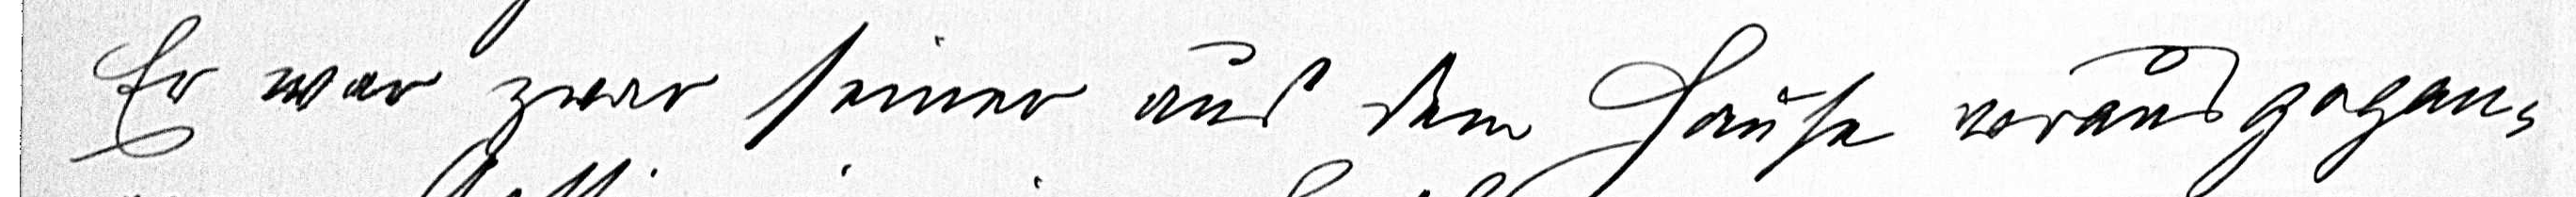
Er war zwar seiner aus dem Hause voraus gegan¬
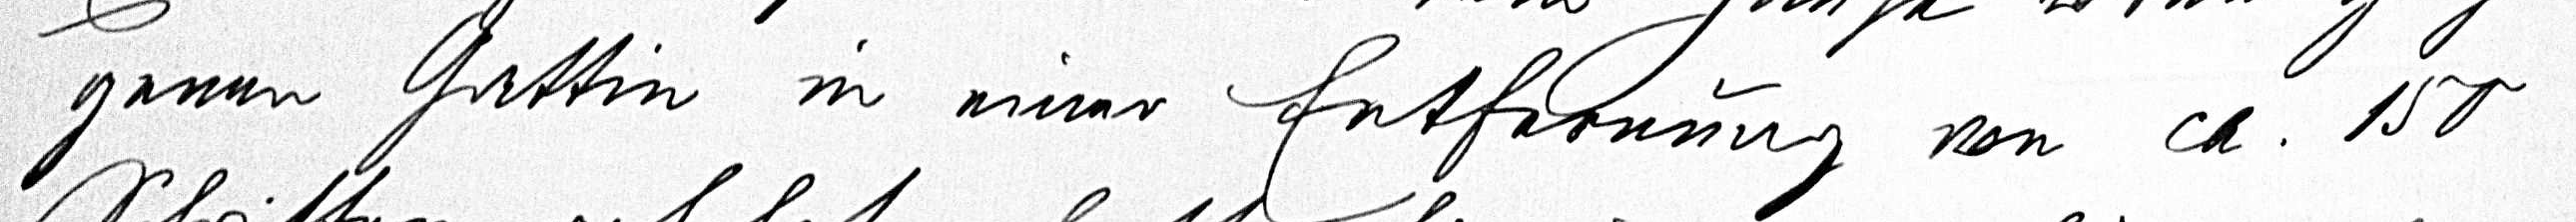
genen Gattin in einer Entfernung von ca 150
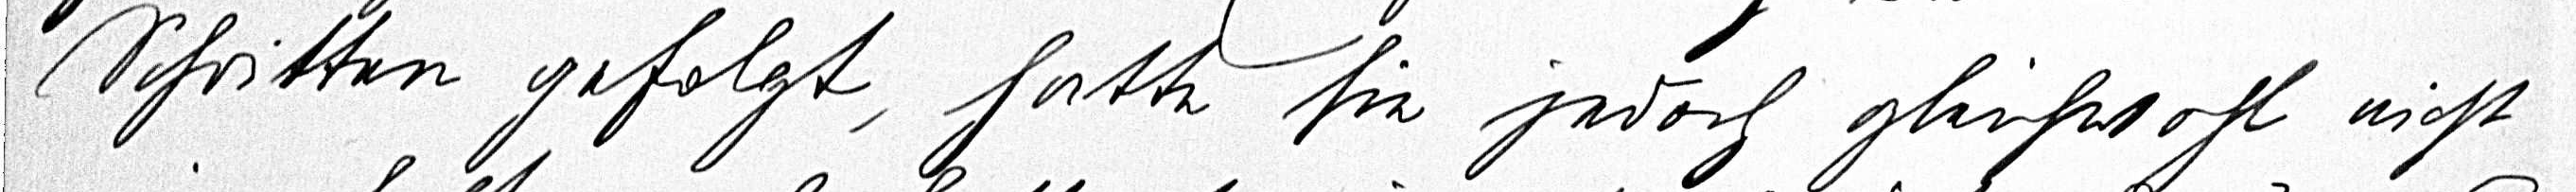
Schritten gefolgt, hatte sie jedoch gleichwohl nicht
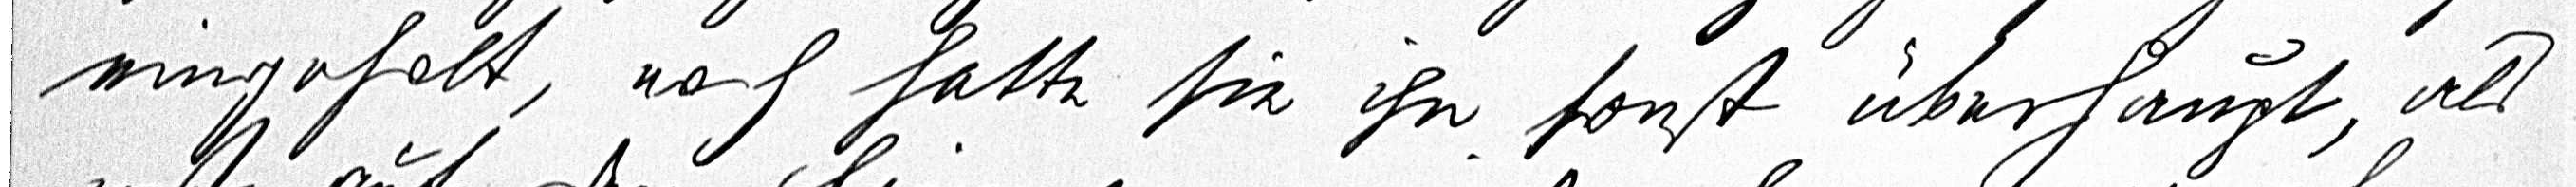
eingeholt, noch hatte sie ihn sonst überhaupt, als
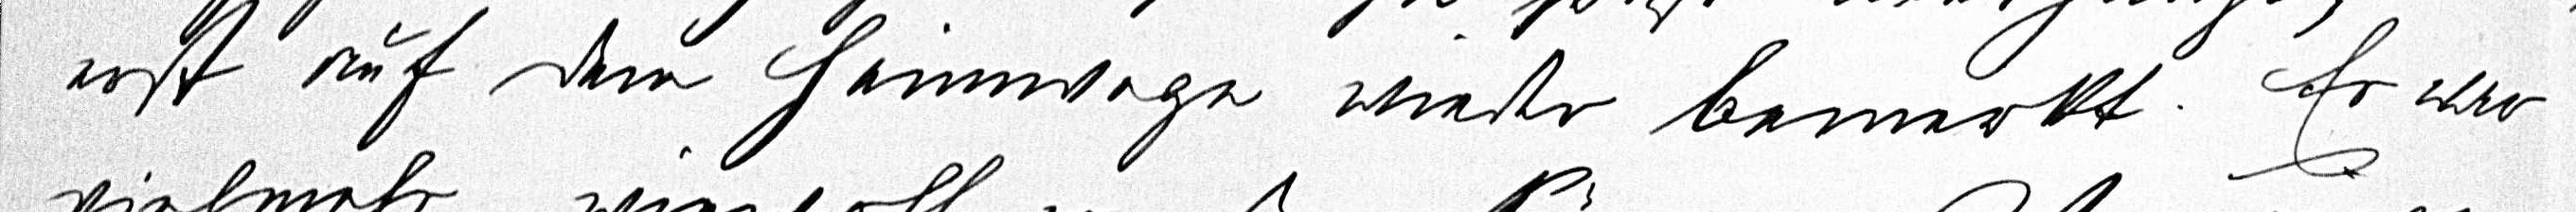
erst auf dem Heimwege wieder bemerkt. Er war
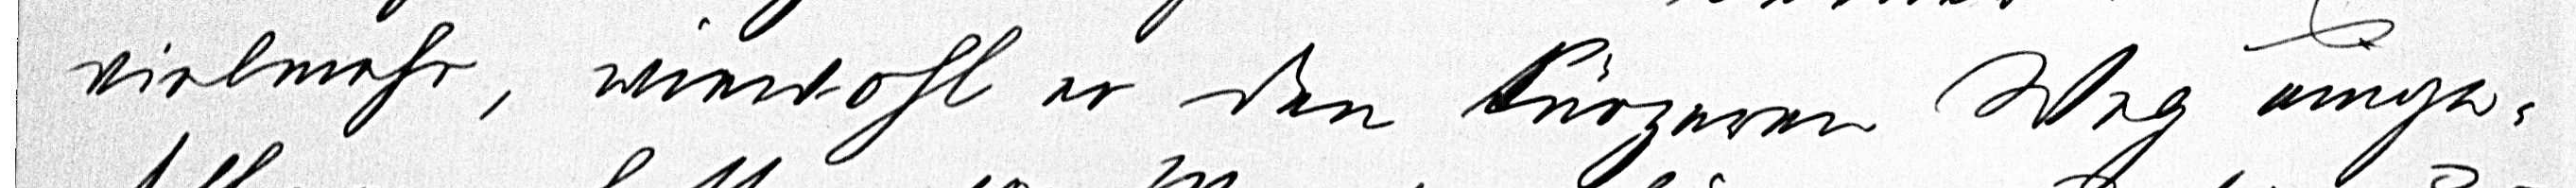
vielmehr, wiewohl er den kürzen Weg einge¬
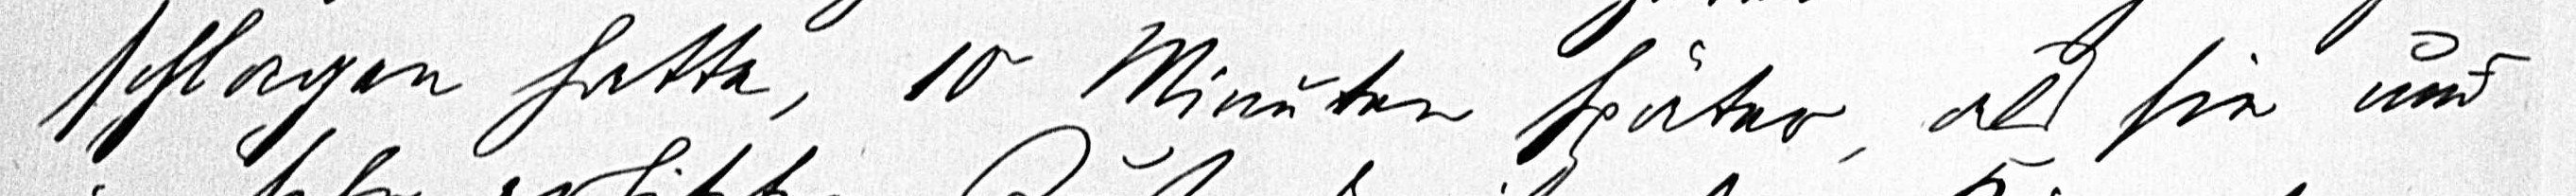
schlagen hatte, 10 Minuten später, als sie und
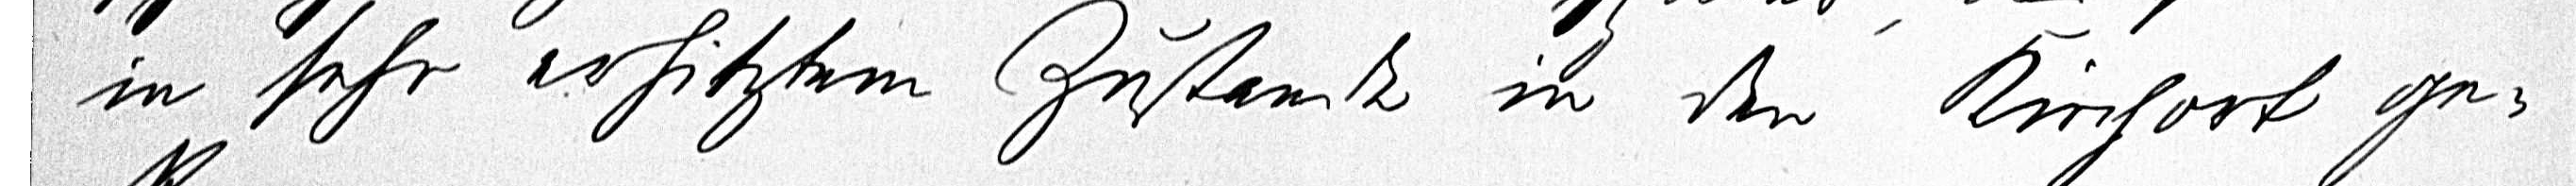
in sehr erhitzten Zustande in den Kirchort ge¬
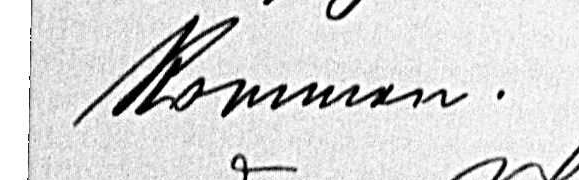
kommen.
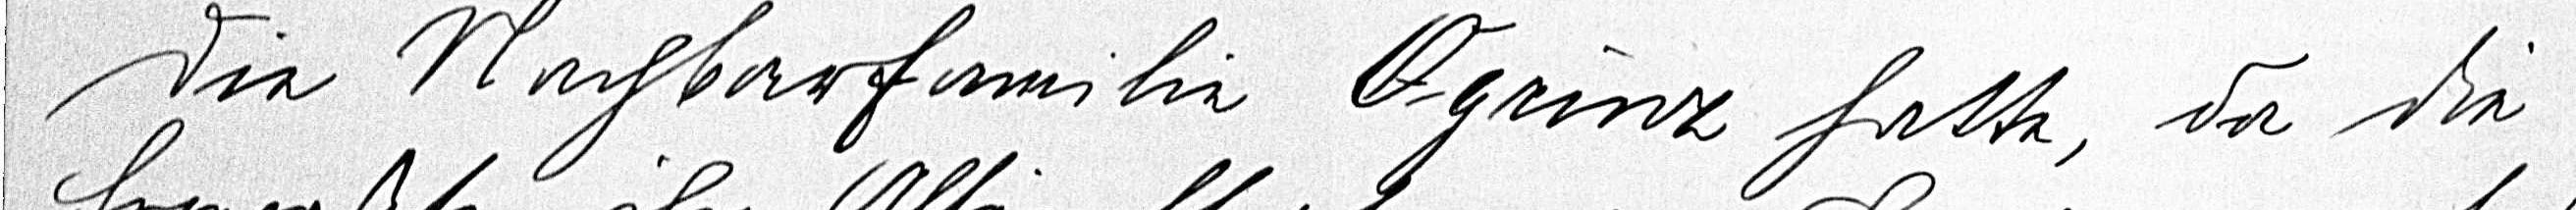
Die Nachbarfamilie Ogrinz hatte, da die
